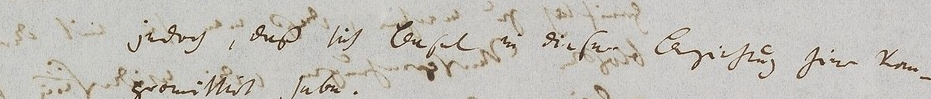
jedoch, daß sich Basel in dieser Beziehung hier kom-
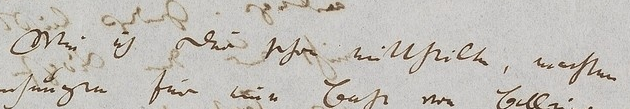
Wie ich Dir schon mittheilte, machten
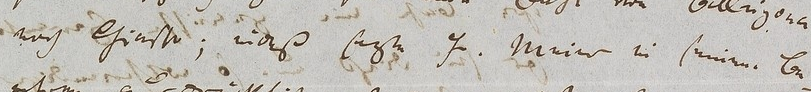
nach Chiasso; indeß sagte Hr. Meier in seinem Be-
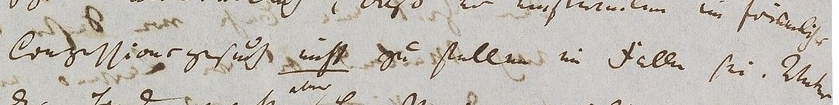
Conzessionsgesuch nicht zu stellen im Falle sei. Unter
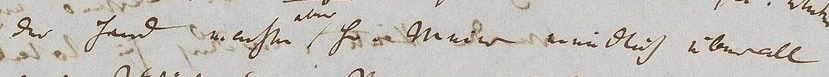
der Hand machte aber Hr. Meier mündlich überall
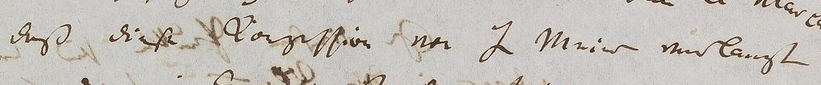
daß diese Konzession von H. Meier verlangt
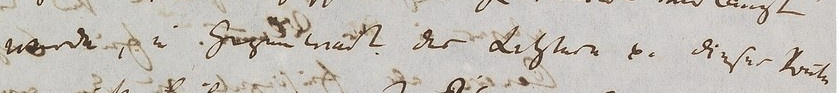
werde, in Gegenwart des Letztern &. dieser konnte
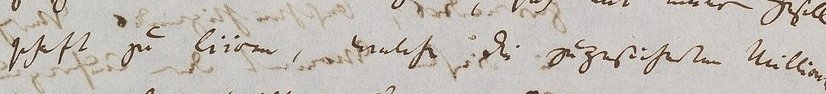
schaft zu liiren, welche die zugesicherten Millionen
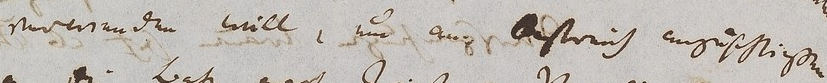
verwenden will, um an Oestreich anzuschließen
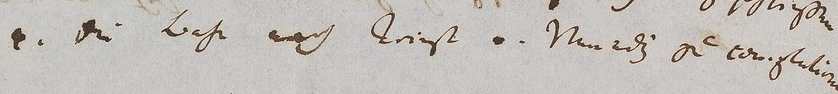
&. die Bahn nach Triest &. Venedig zu completiren.
